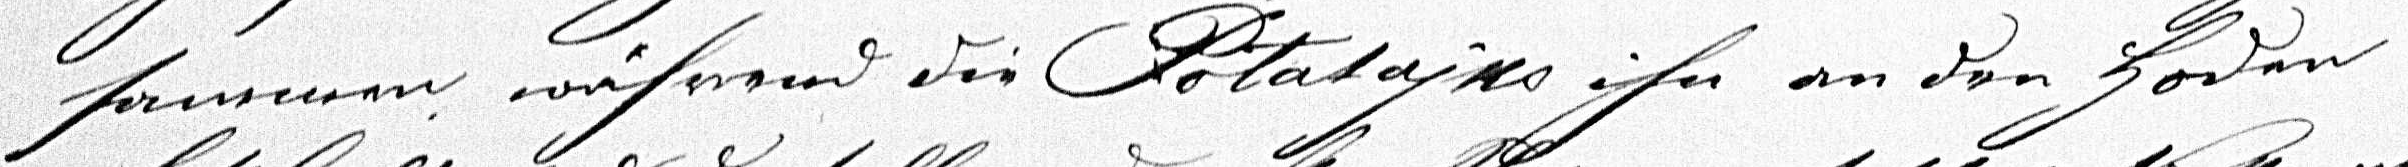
sammen während die Połatajko ihn an den Boden
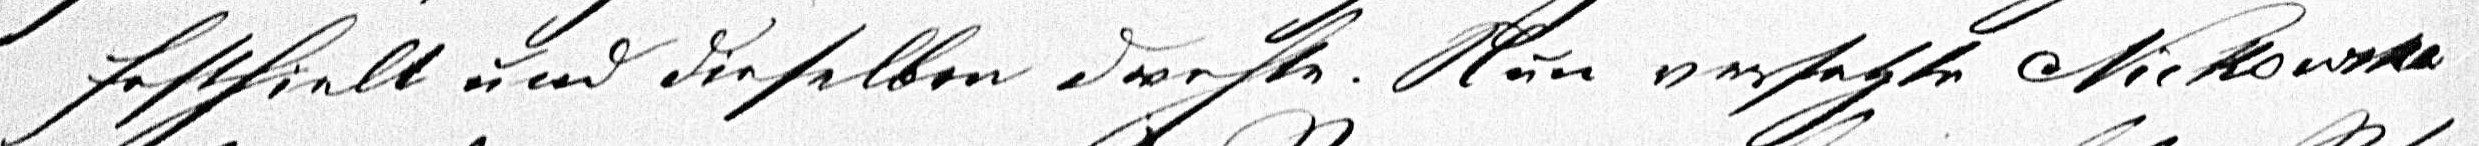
festhielt und dieselben drehte. Nun versetzte Nickowska
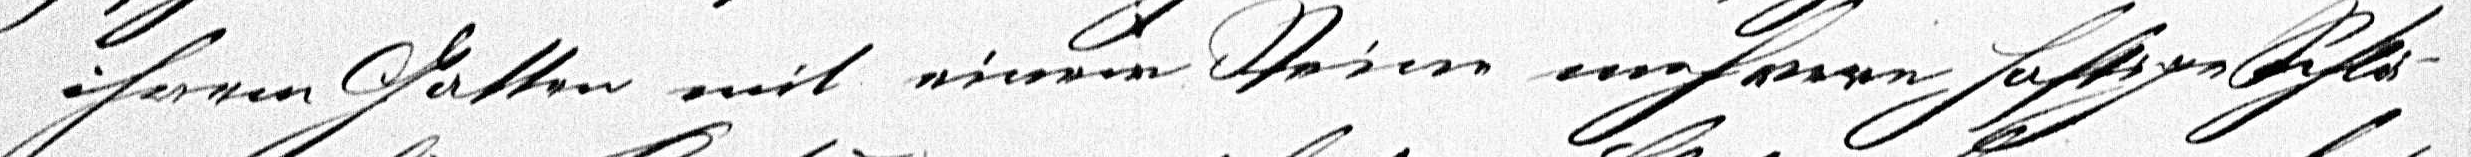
ihrem Gatten mit einem Steine mehrere heftige Schlä¬
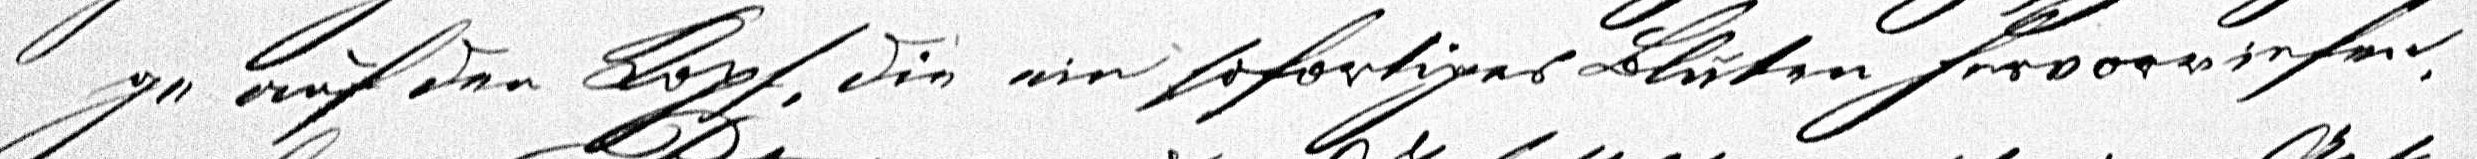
ge auf den Kopf, die ein sofortiges Bluten hervorriefen
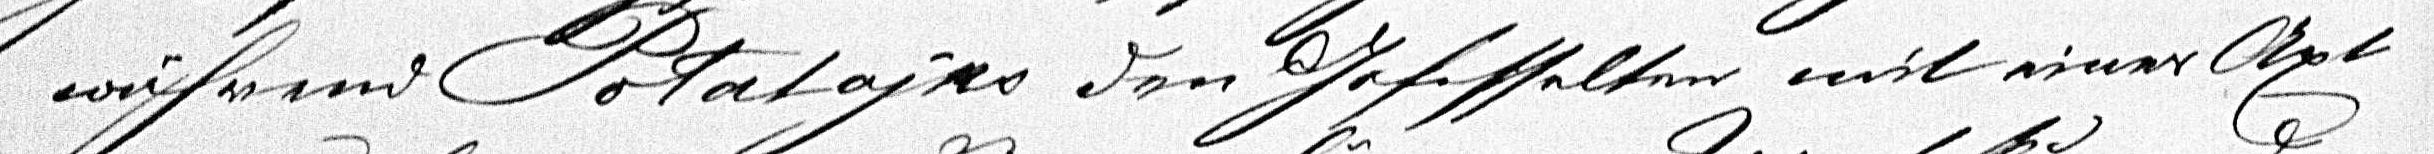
während Połatajko den Gefesselten mit einer Axt
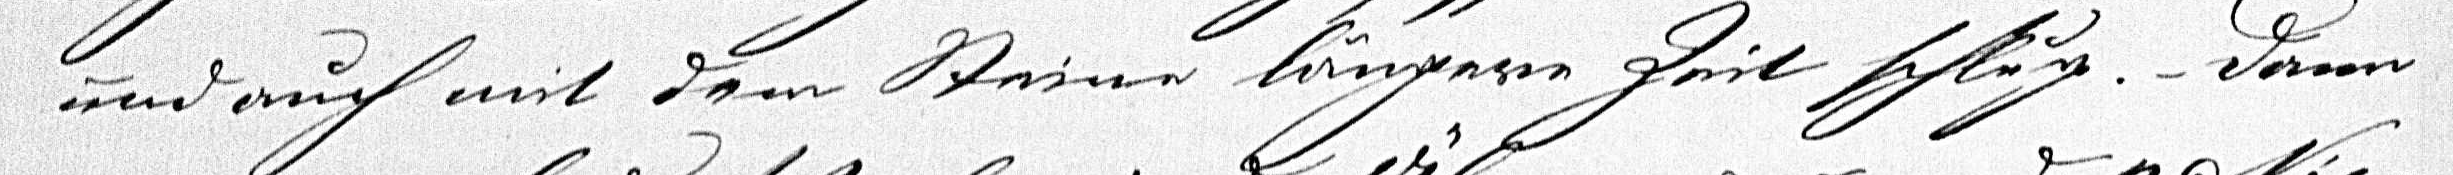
und auch mit dem Steine längere Zeit schlug. Dann
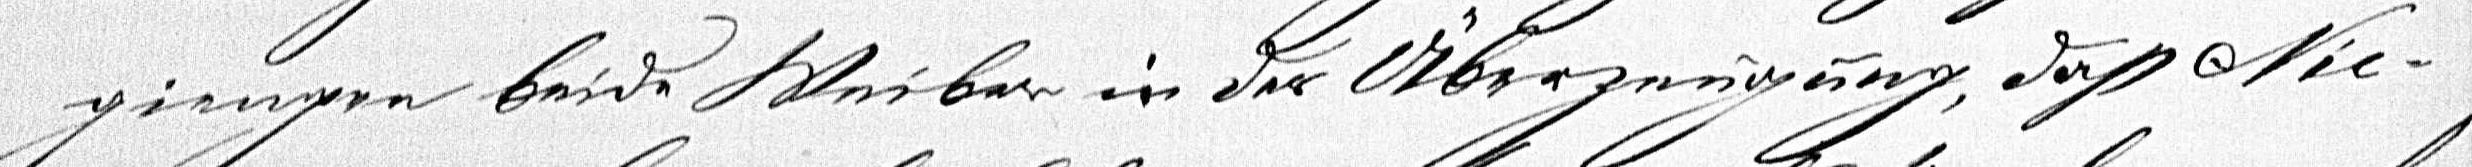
giengen beide Weiber in der Überzeugung, daß Nic¬
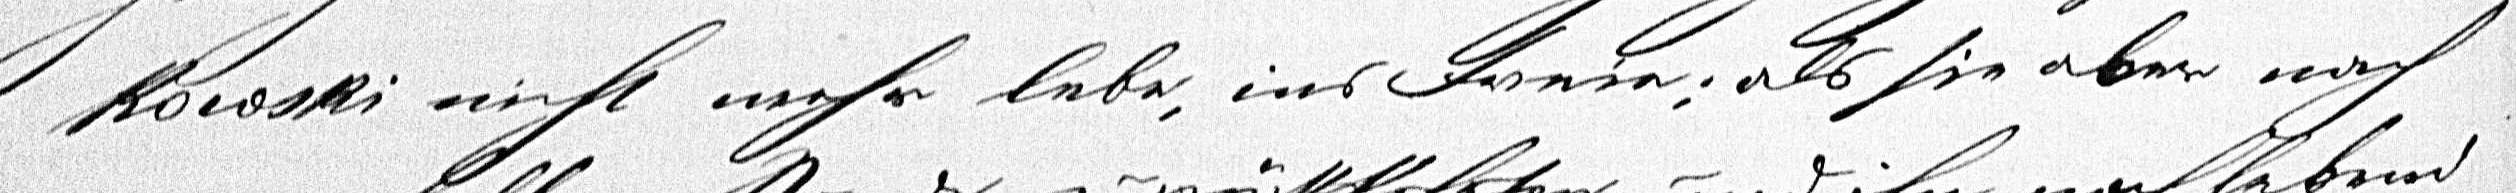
kowski nicht mehr lebe, ins Freie: als sie aber nach
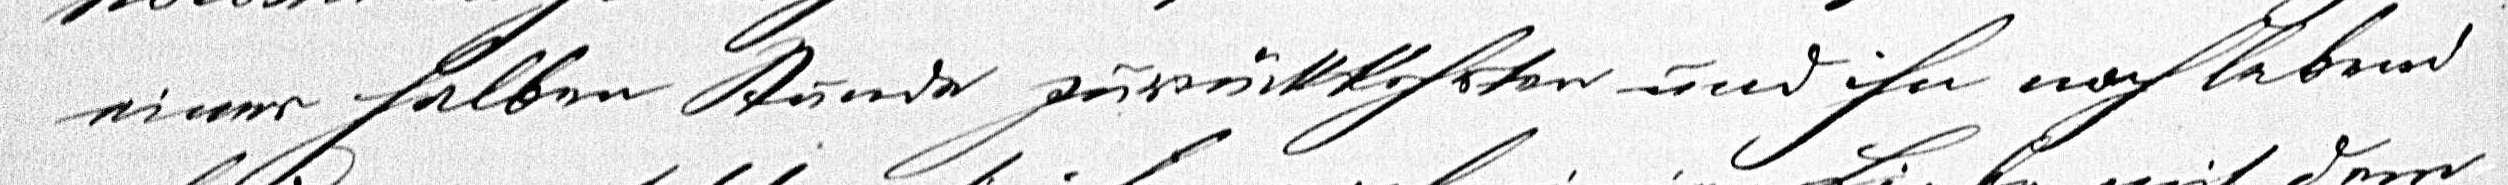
einer halben Stunde zurückkehrten und ihn noch lebend
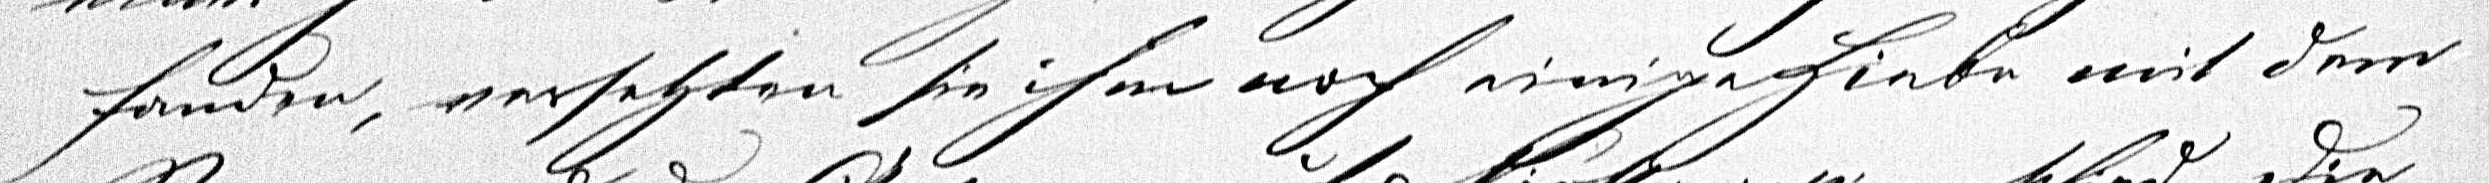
fanden, versetzten sie ihm noch einige Hiebe mit dem
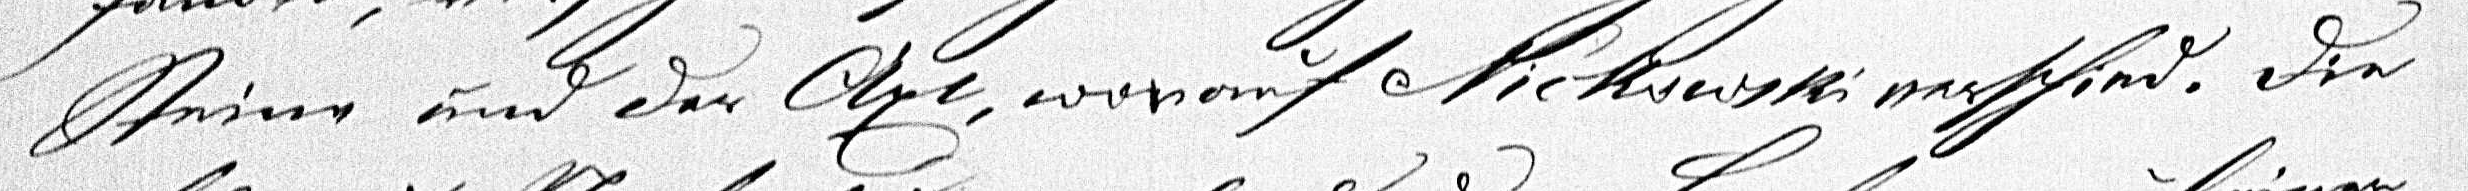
Steine und der Axt, worauf Nickowski verschied. Die
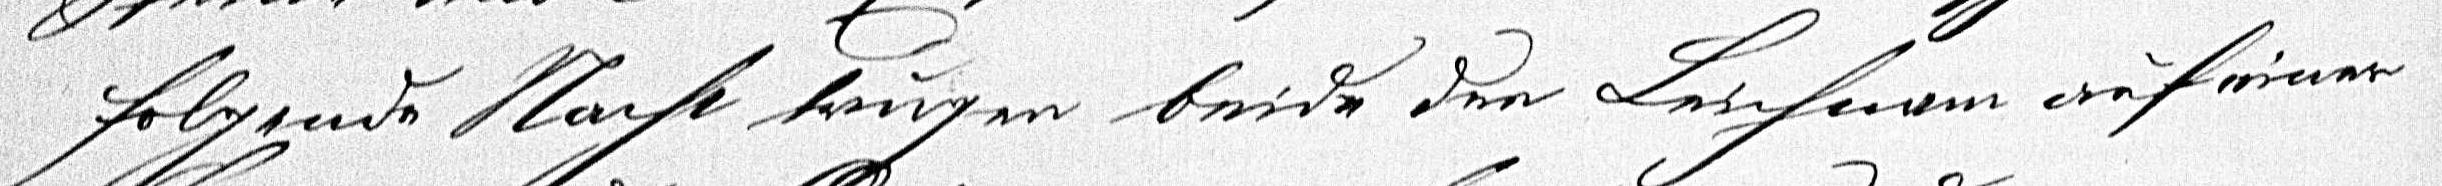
folgende Nacht trugen beide der Leichnam auf einer
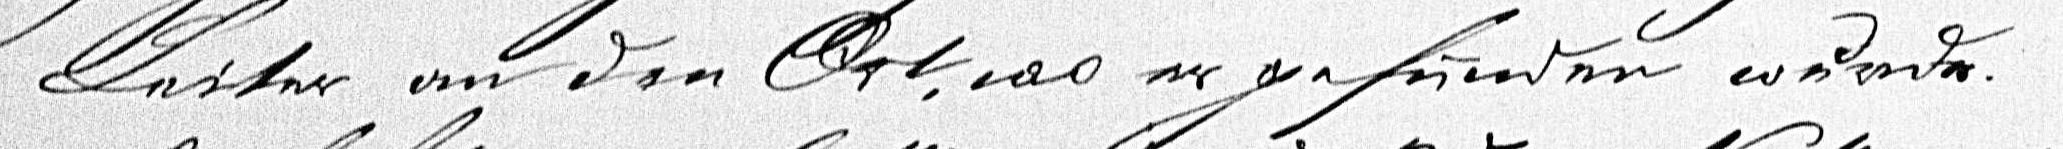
Leiter an den Ort, wo er gefunden wurde.
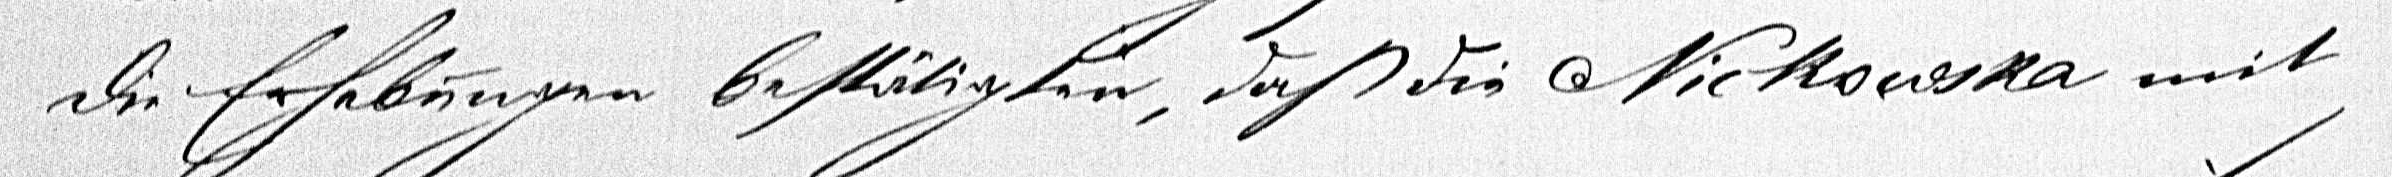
Die Erhebungen bestätigten, daß die Nickowska mit
